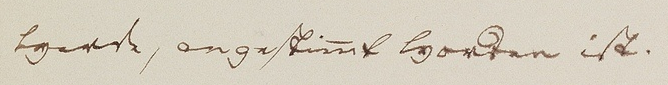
werde, angestimmt worden ist.
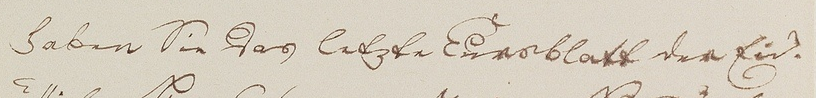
Haben Sie das letzte Cursblatt der Eid-
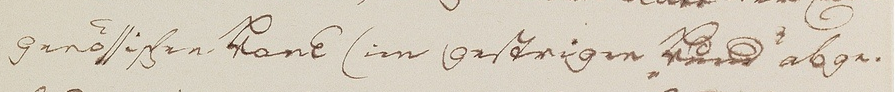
genössischen Bank (im gestrigen «Bund» abge-
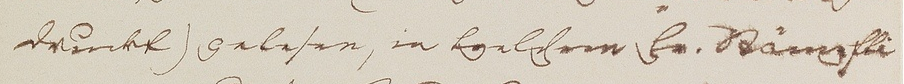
druckt) gelesen, in welchem Hr. Stämpfli
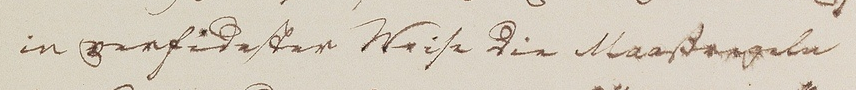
in perfidester Weise die Maaßregeln
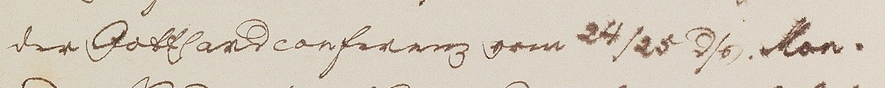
der Gotthardconferenz vom 24/25 dss. Mon.
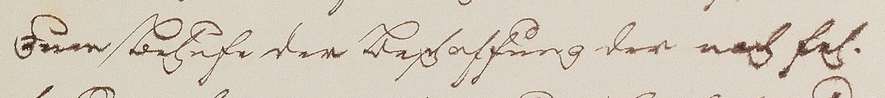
zum Behufe der Beschaffung der noch feh-
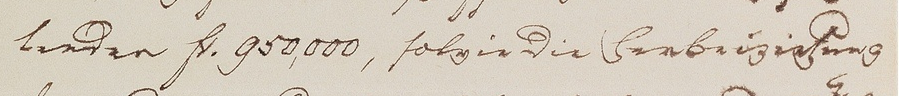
lenden Fr. 950,000, sowie die Herbeiziehung
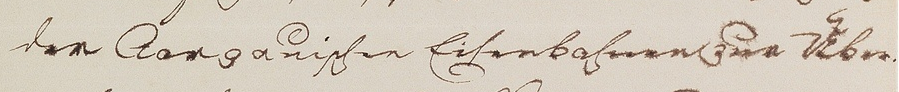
der Aargauischen Eisenbahnen zur Über-
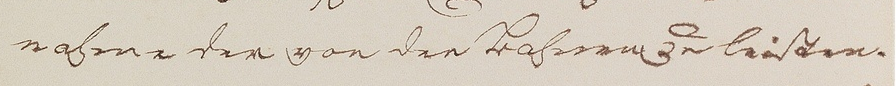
nahme der von den Bahnen zu leisten-
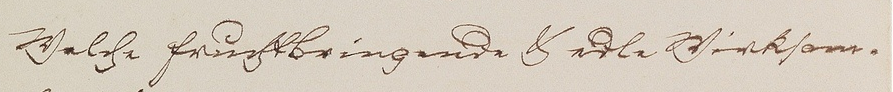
Welche fruchtbringende & edle Wirksam-
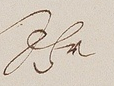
Escher
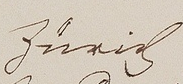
Zürich
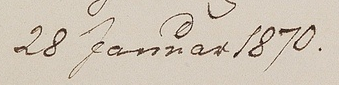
28 Januar 1870.
